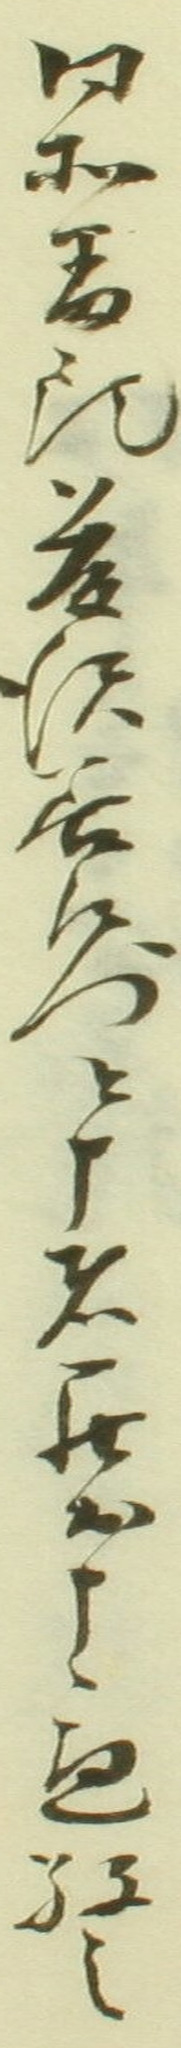同所番頭藤沢善左衛門と申者罷出申候返警
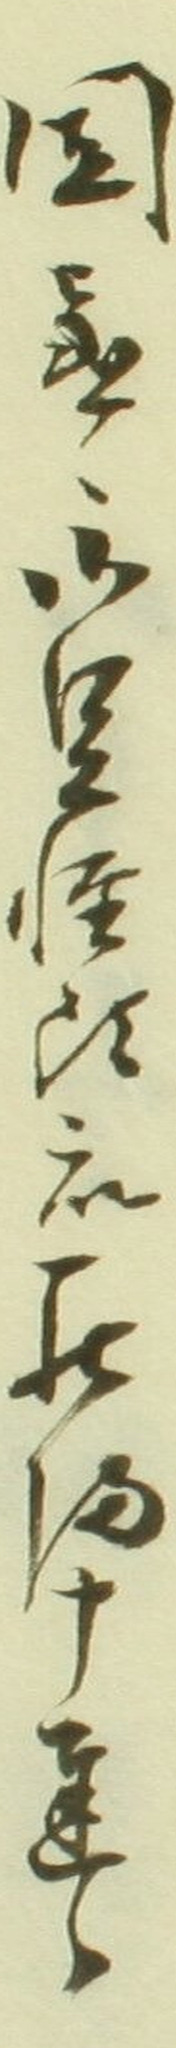固被遣候御足軽頭衆罷帰申達候
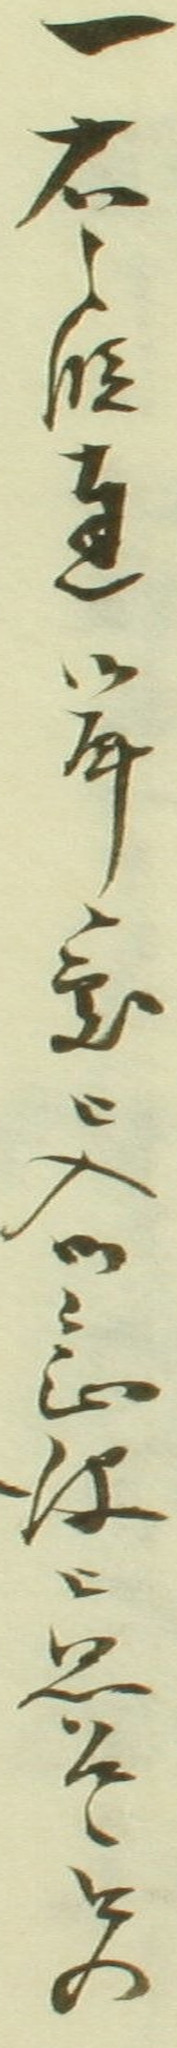一右之段達御耳候処被入御念儀被思召候今の
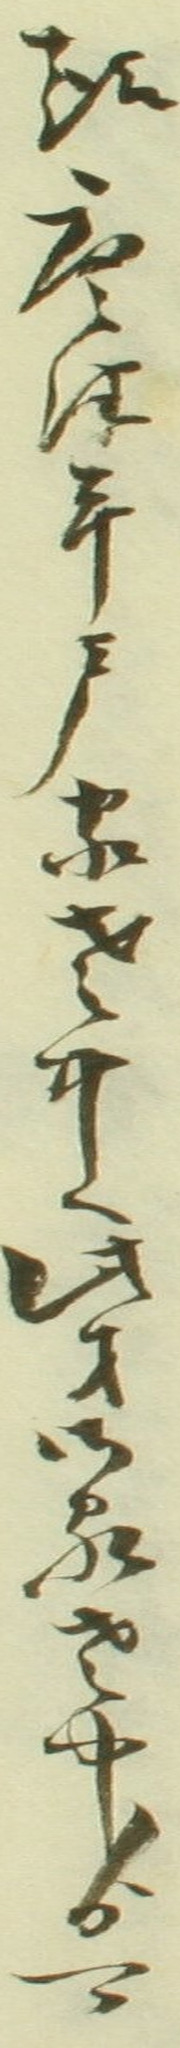趣唐津平戸家老中へ此等御家老中ゟ可
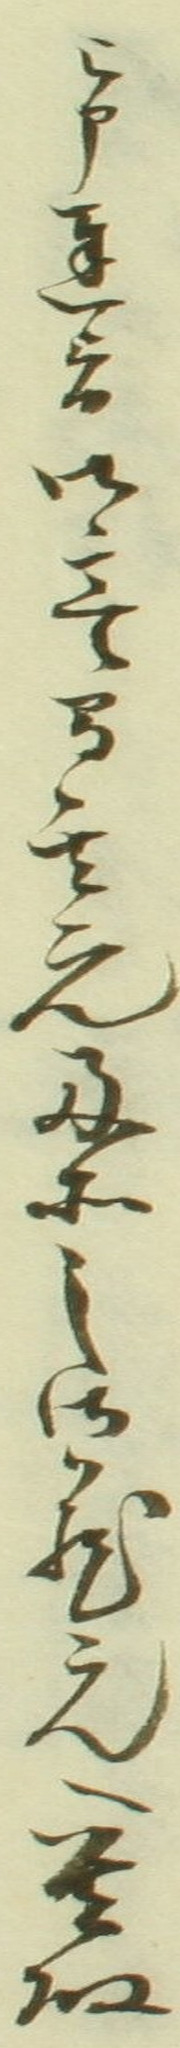被申達旨御意候間其元両所之御蔵元へ貴殿
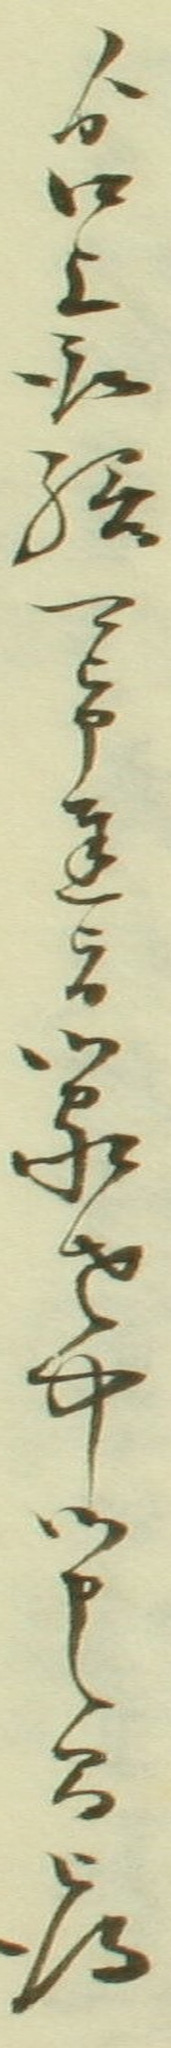ゟ口上取繕可被申達旨御家老中御申候間被得
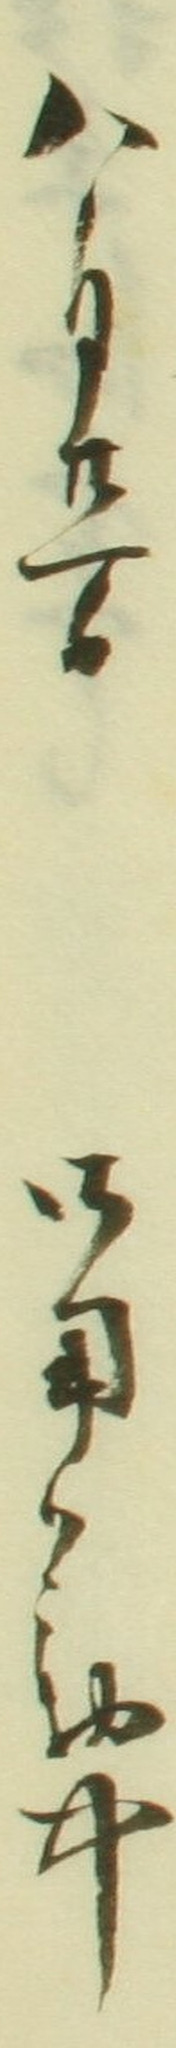八月廿一日御用勤中

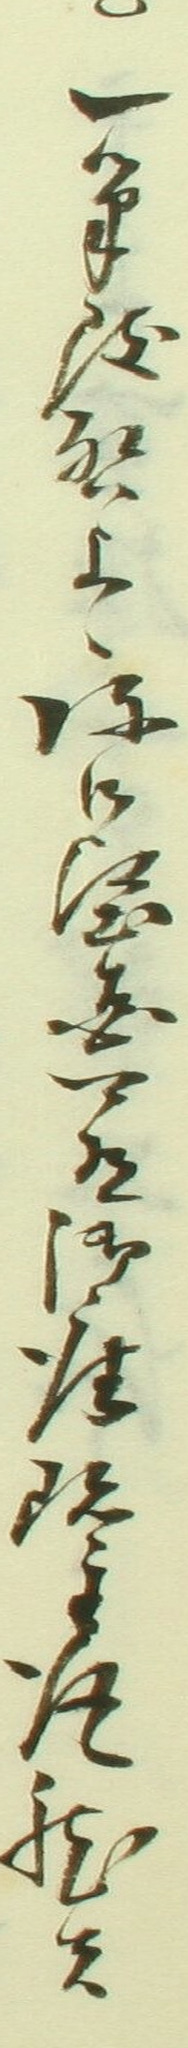○一筆致啓上候弥御堅固可有御座珍重存候然者
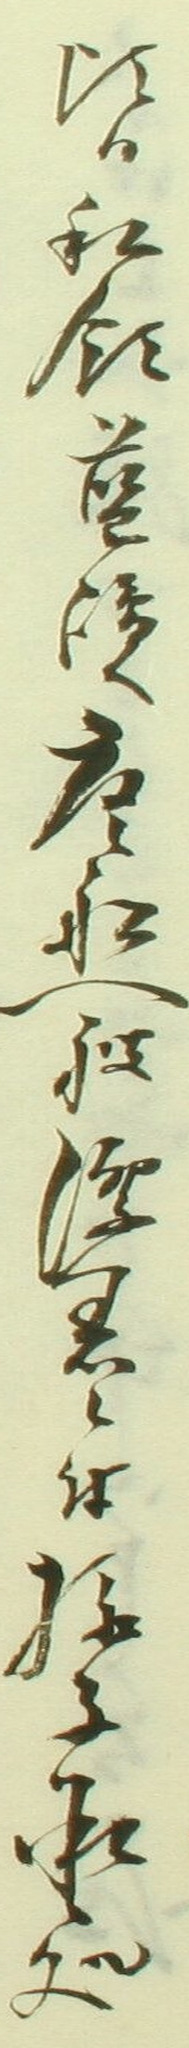頃日私領藍嶋へ唐船一艘漂着ニ付様子承候処
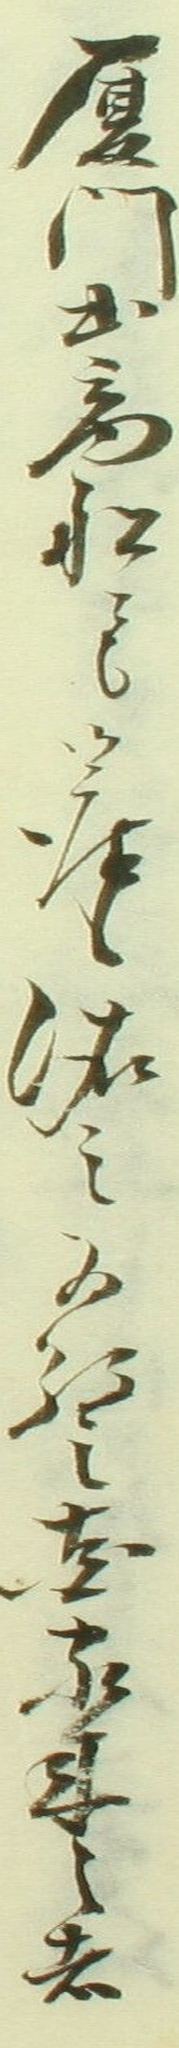厦門出商船にも御座候依之為警固家来之者
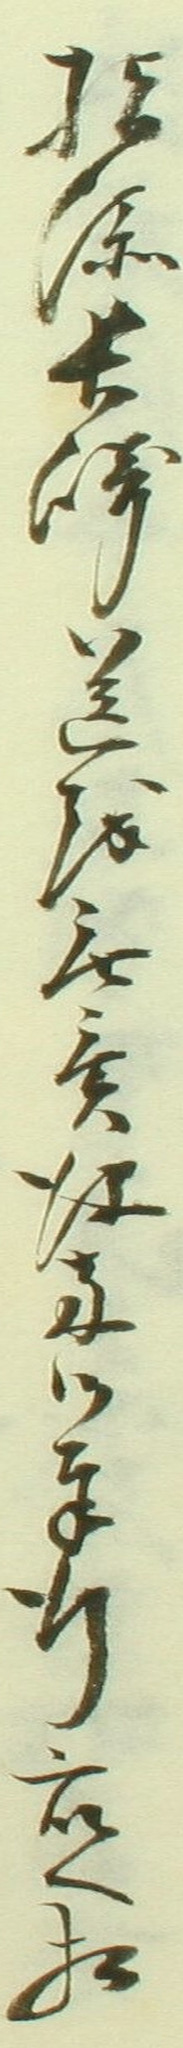指添長崎送越無異儀両御奉行衆へ相
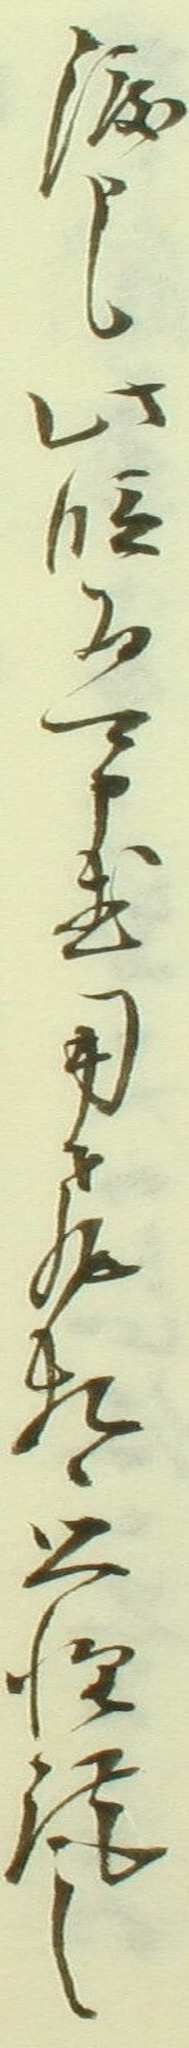渡申候此段為可申置用飛札候恐惶謹言
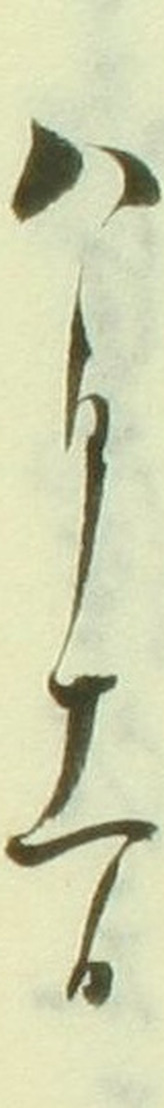八月十一日
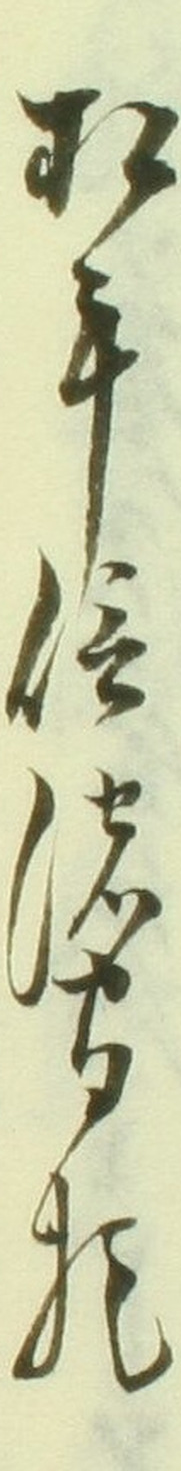松平信濃守様
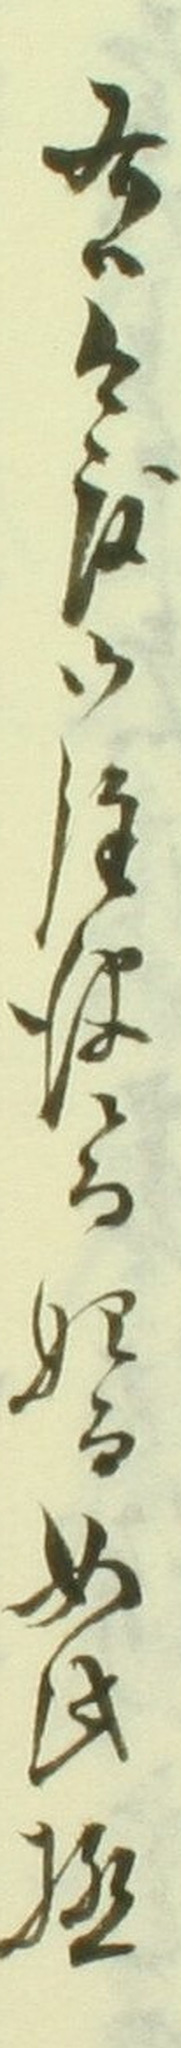右ハ今度御詮議ニ而始而如此極
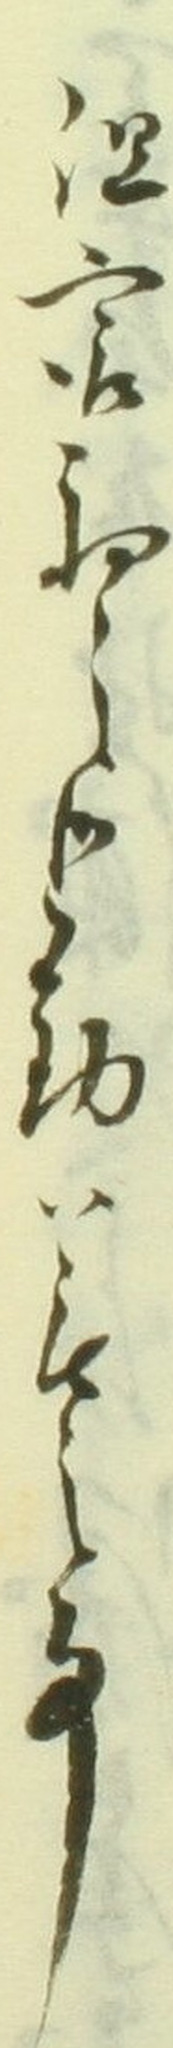但最初之御勤ハ無之事
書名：異国船漂着記
